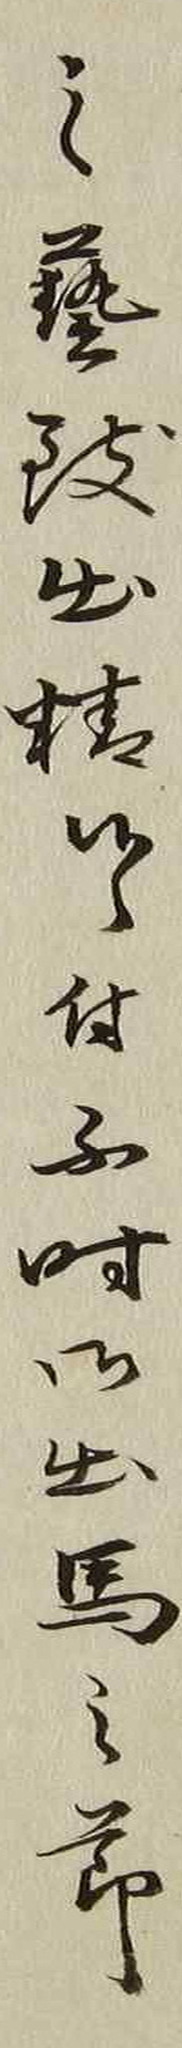之芸出精致し候ニ付き不時御出馬之節
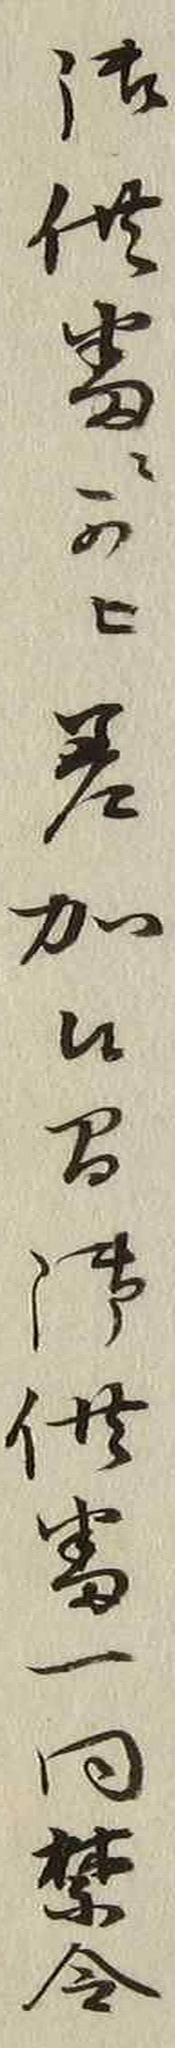御供番ニ差し加えられ候間御供番一同禁令
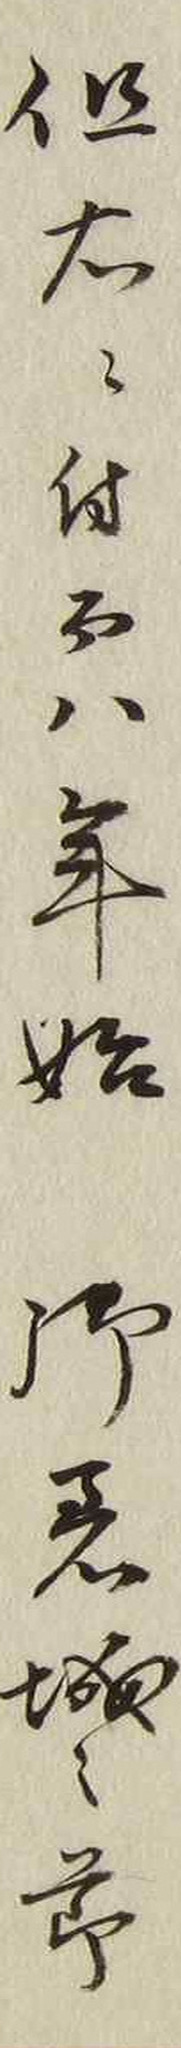但し右ニ付て年始御着城之節

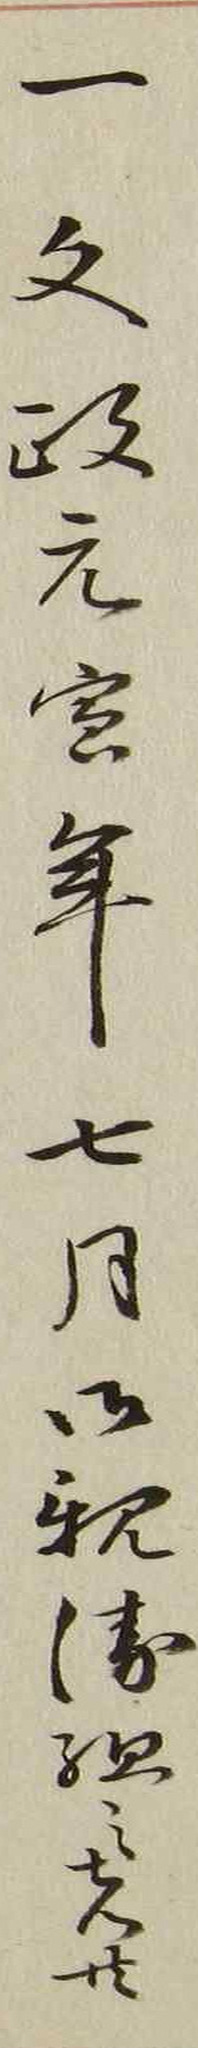一文政元寅年七月御親情組之者共
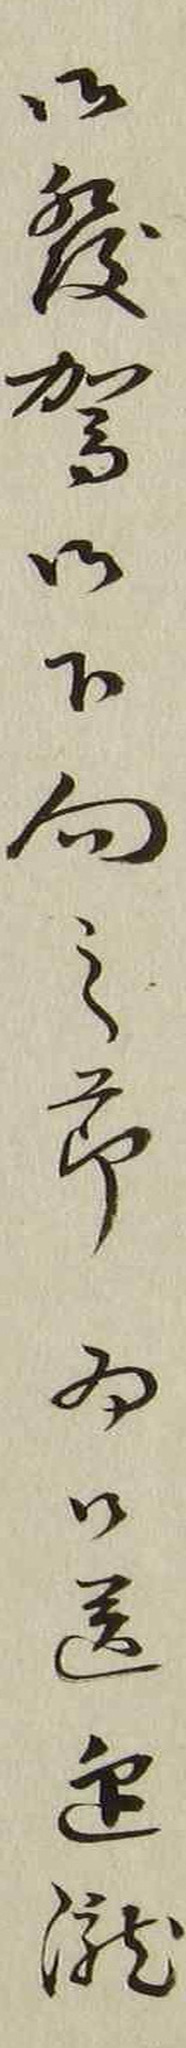御発駕御下向之節御送迎之為瀧
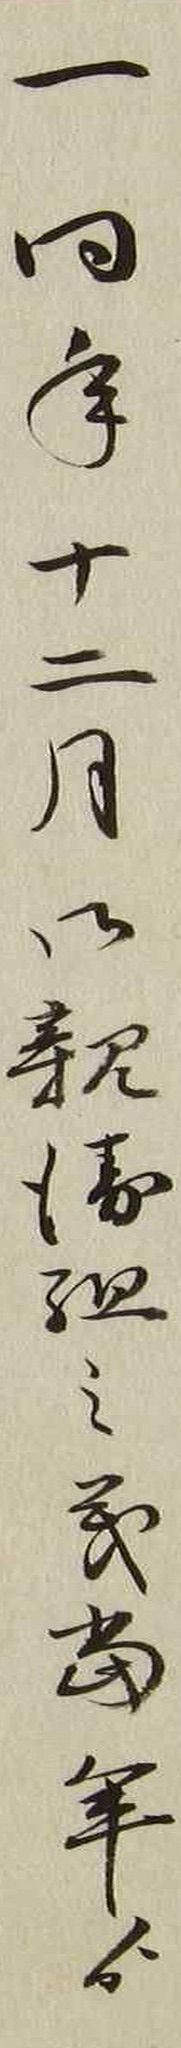一同年十二月御親情組之義当年より
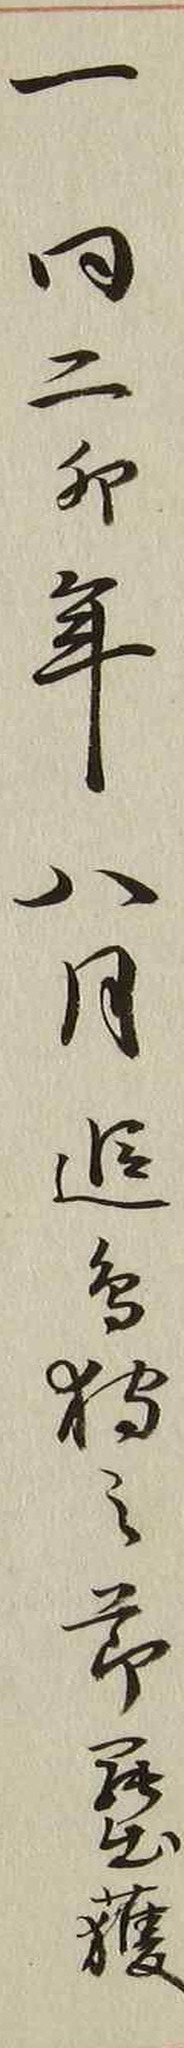一同二卯年八月追鳥狩之節罷り出で獲
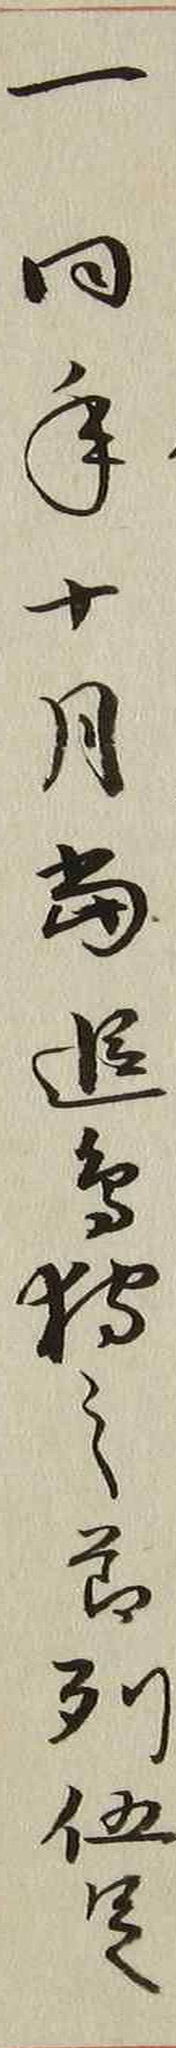一同年十月当追鳥狩之節列伍足
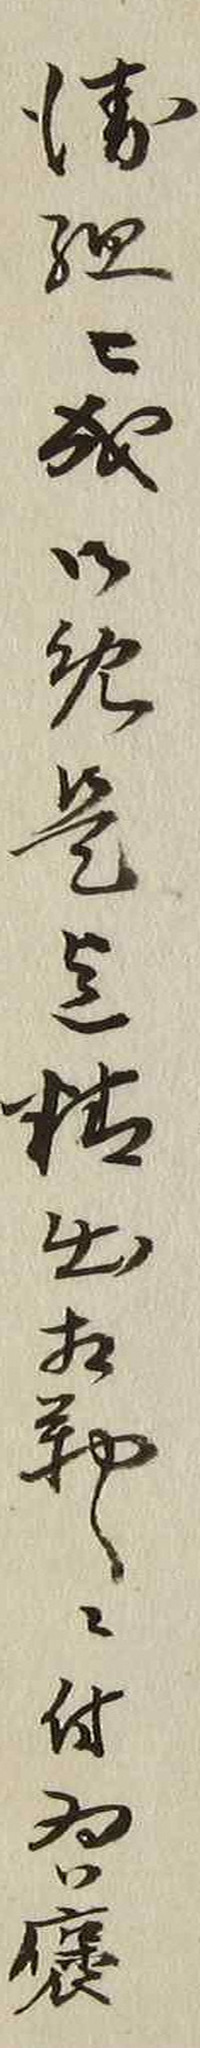情組御免成られ是迄精出し相勤め候ニ付き御褒
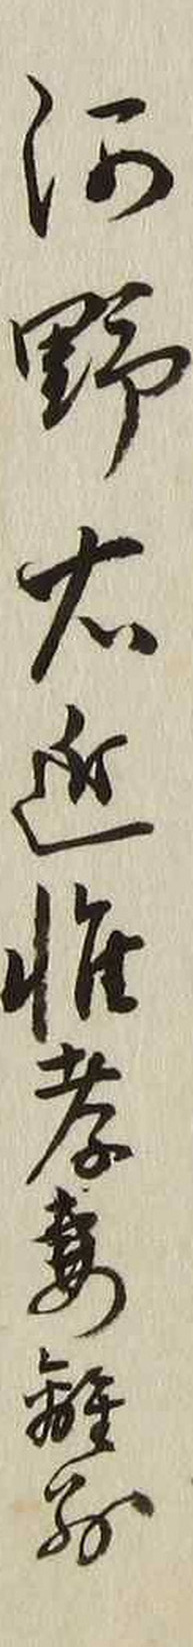女河野右近惟孝妻離別
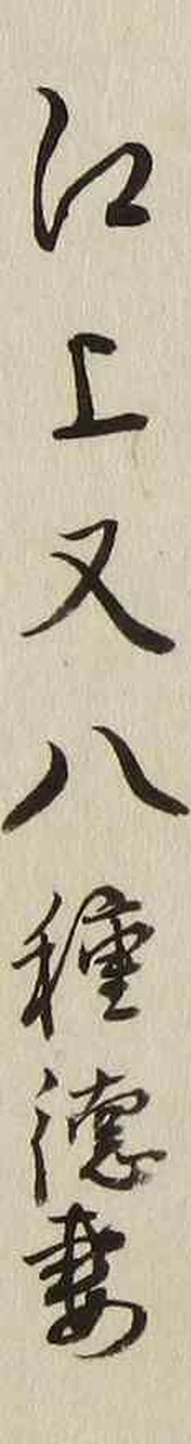江上又八種徳妻
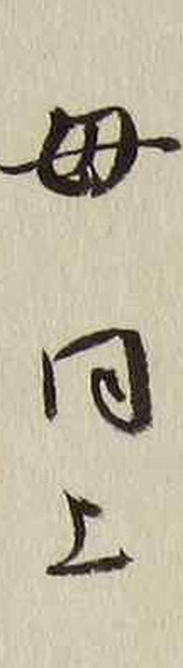母同上
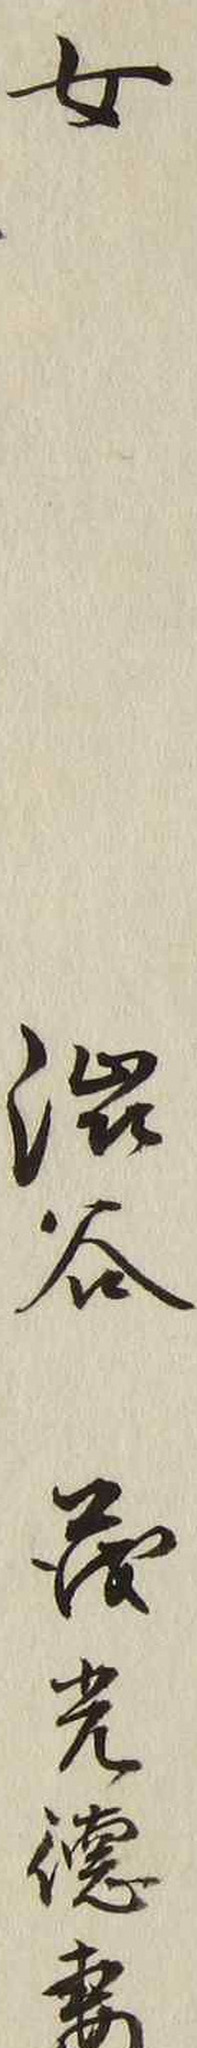女渋谷茂光徳妻
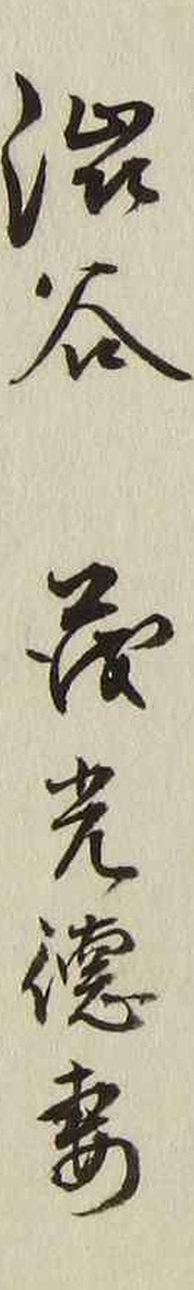女渋谷茂光徳妻
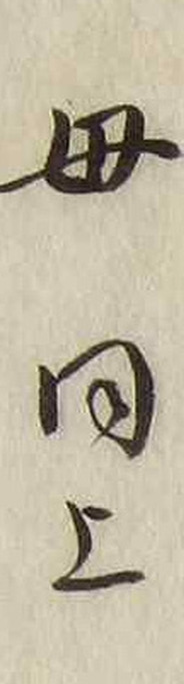母同上

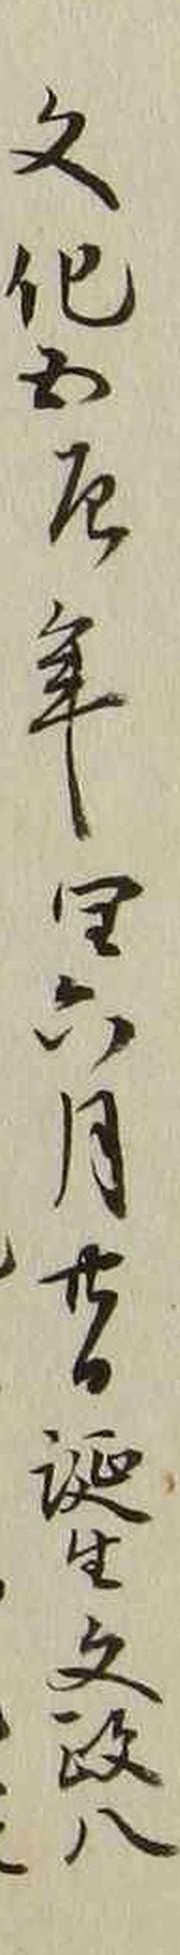文化五辰年閏六月廿日誕生文政八
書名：諸士系譜　巻之16　い之部16
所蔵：会津若松市立会津図書館
